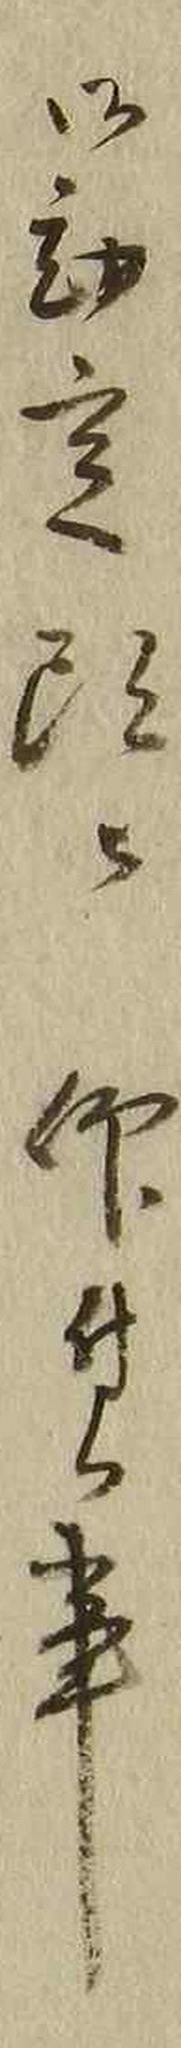御勘定頭被仰付候事
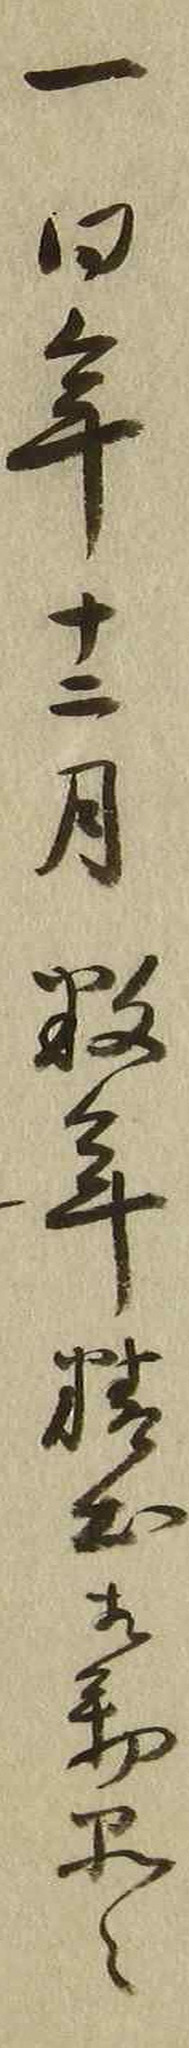一同年十二月数年精出相勤品々
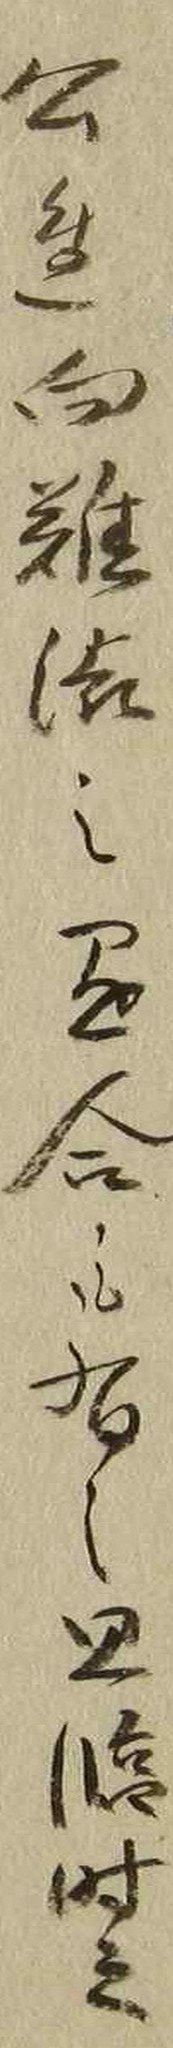公辺向難渋之懸合も有之且臨時之
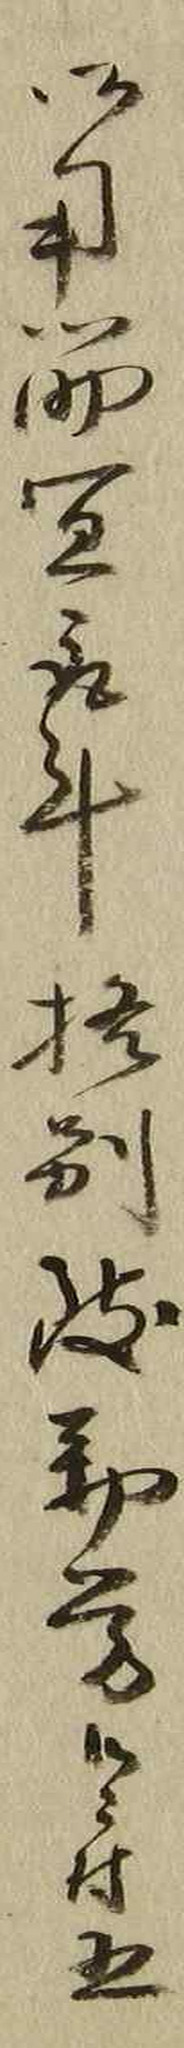御用筋宜取計格別致勤労候ニ付五
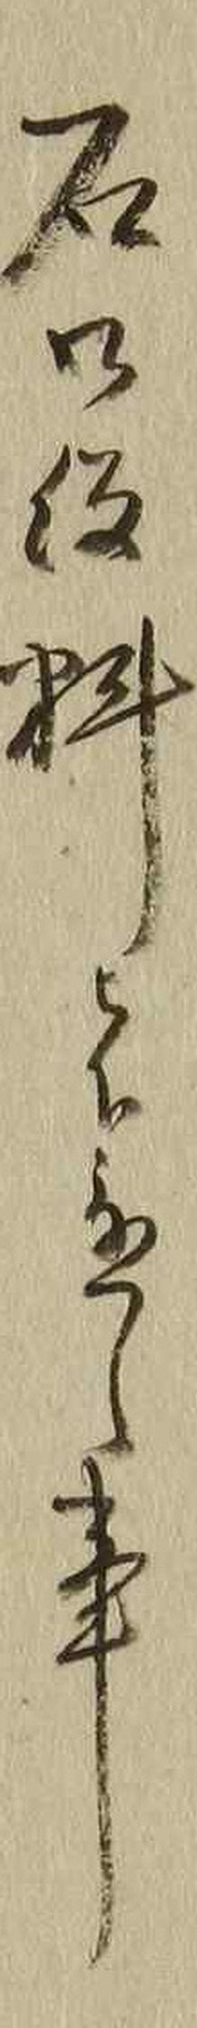石御役料被下置候事
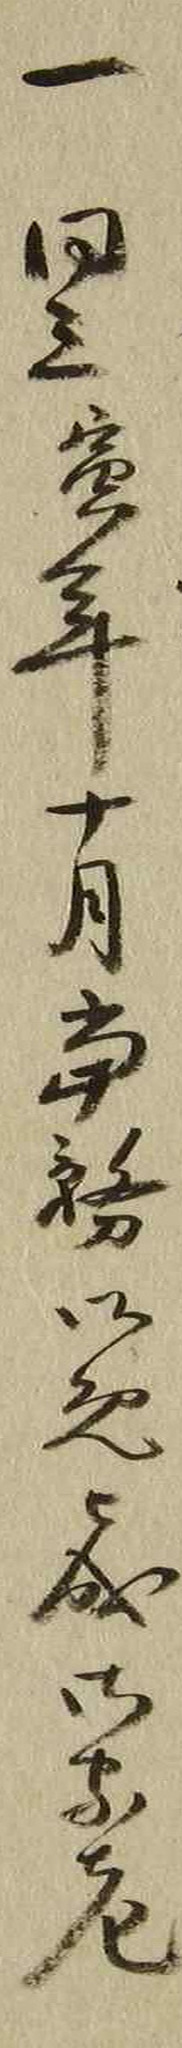一同三寅年十月当務御免被成御家老
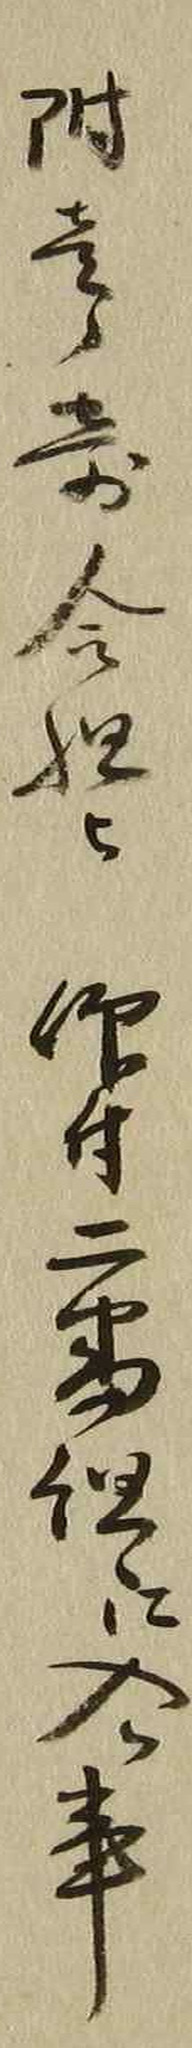附壱ノ寄合組被仰付二番組江入候事
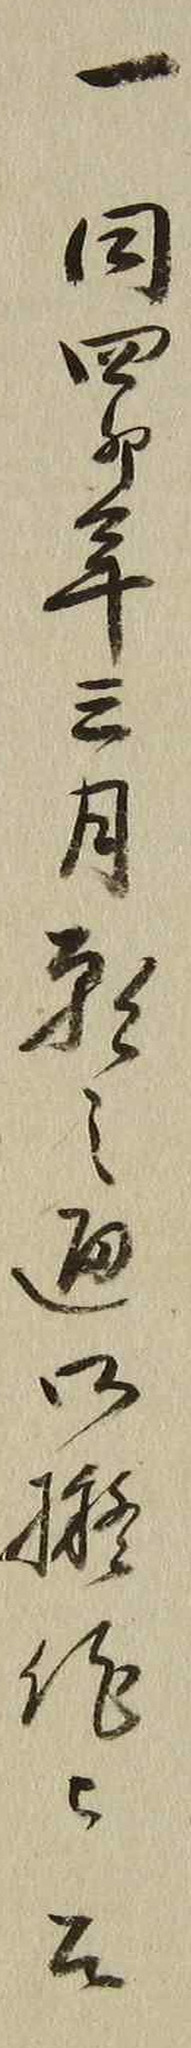一同四卯年三月願之通御擬作被召
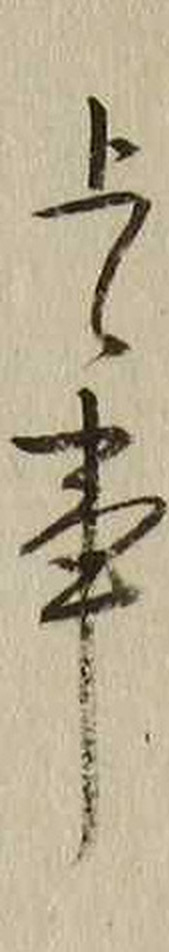上候事
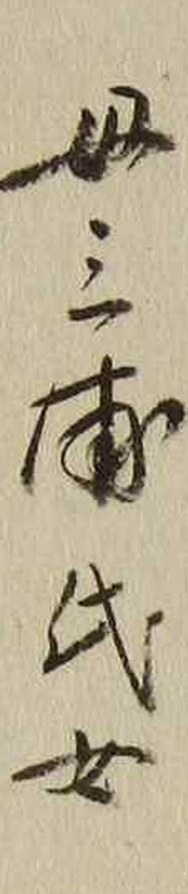母三浦氏女
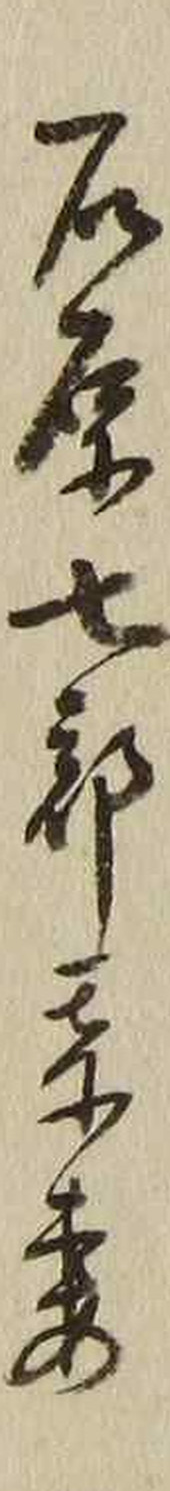女石原七郎某妻
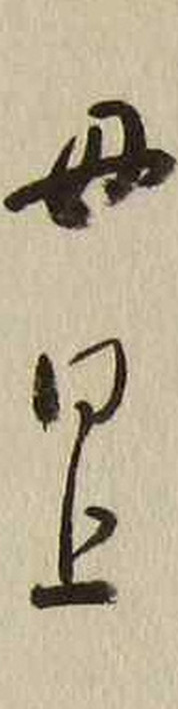母同上

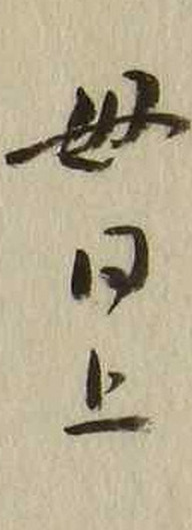女同上
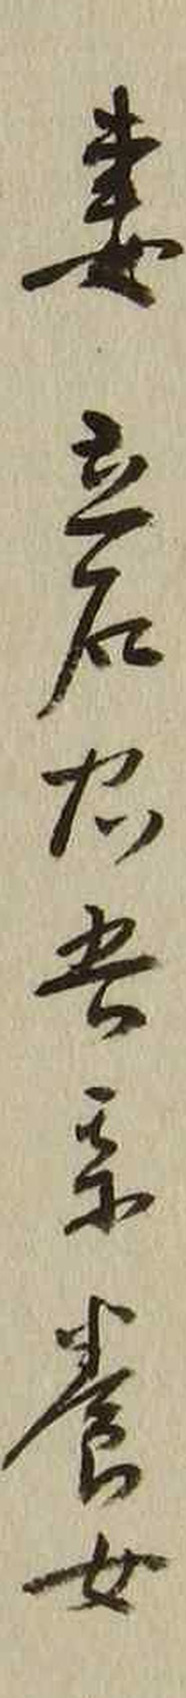妻立石忠吾某養女
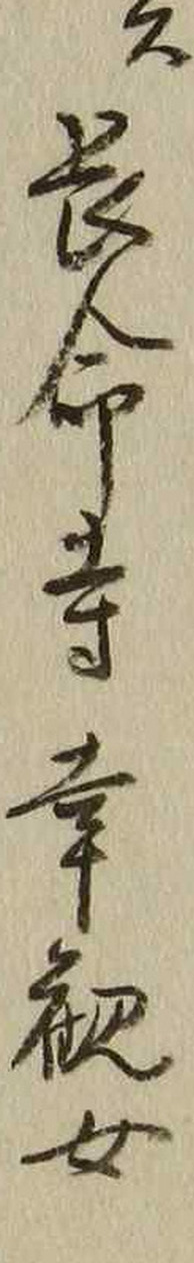実長命寺幸観女
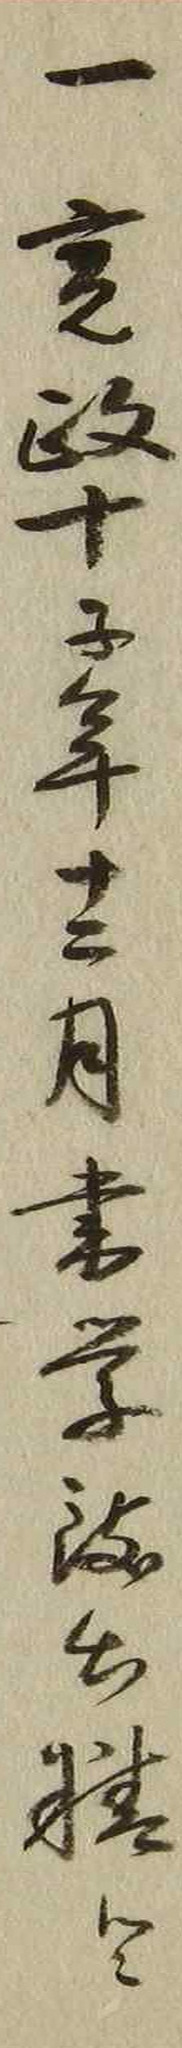一寛政十子年十二月書学致出精候ニ
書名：諸士系譜　巻之236　ふ之部4
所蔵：会津若松市立会津図書館
